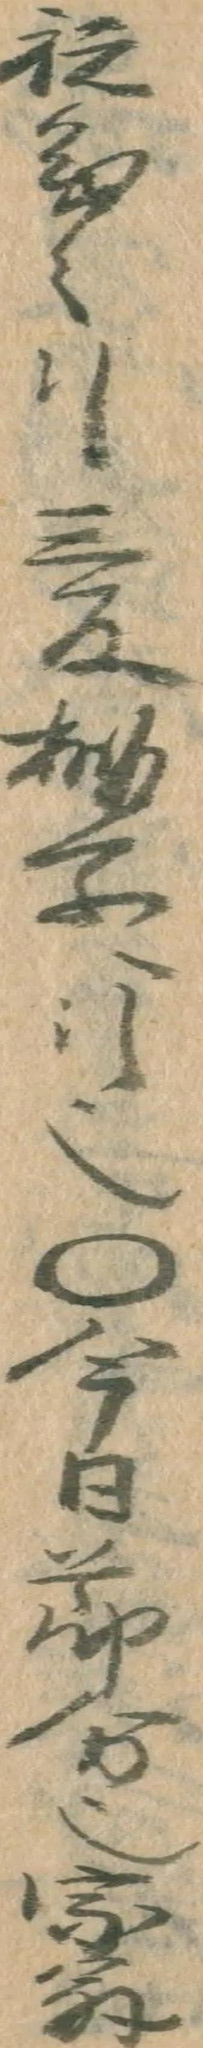祝義之引三反棚所へ引也○今日節分也家翁
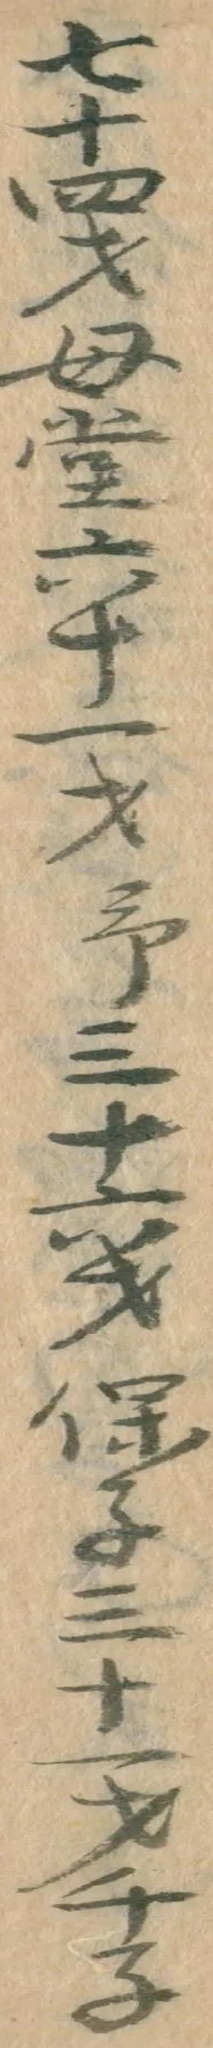七十四才母堂六十一才予三十六才保子三十一才千子

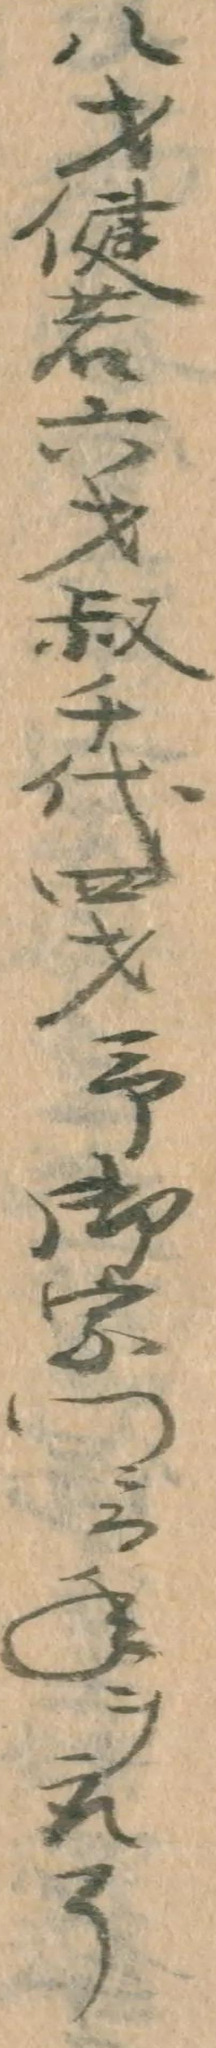八才健若六才叔千代四才予御家門ニ而年ヲ取了
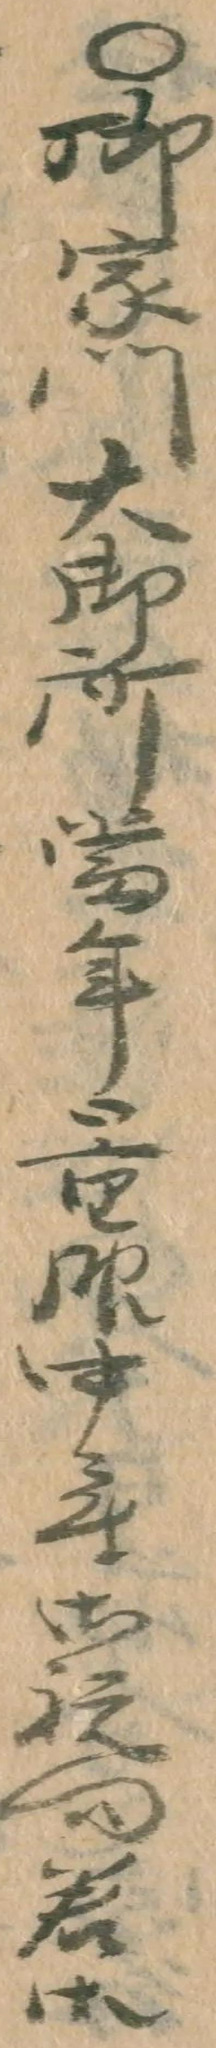○御家門大御所當年御重服ニ付御祝向若御
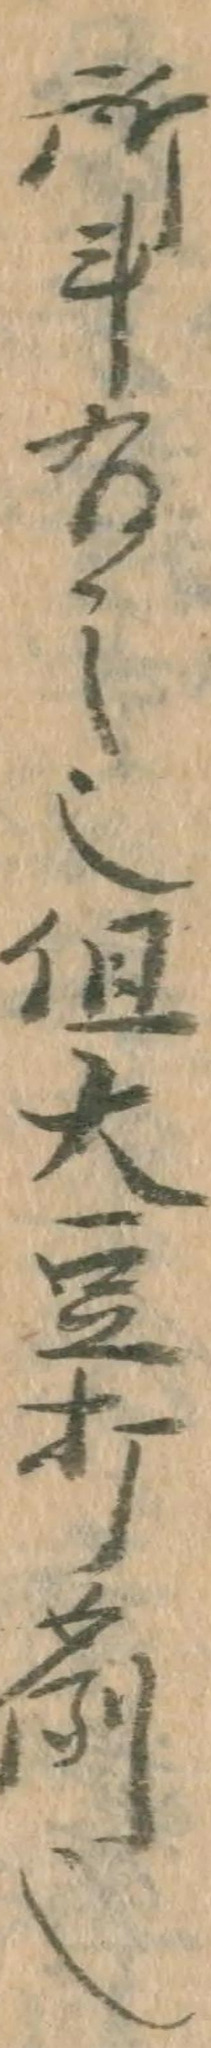御計有之也但大豆打如例也
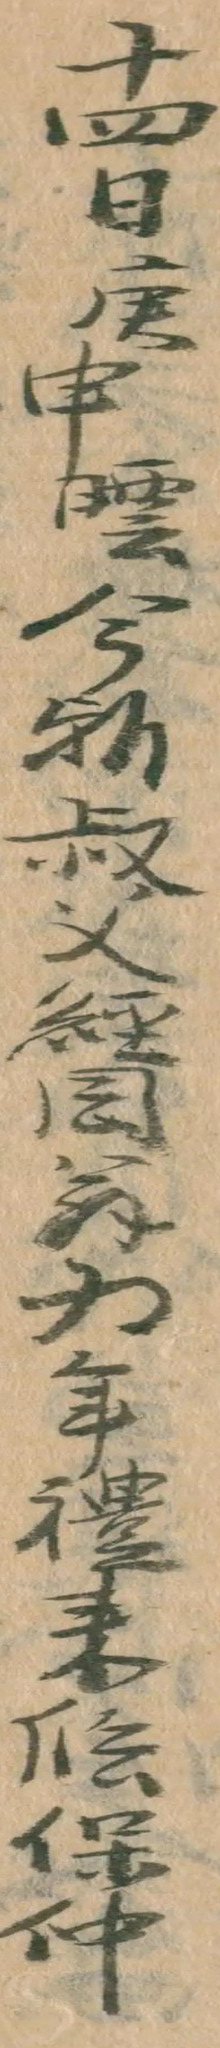十四日庚申曇今朝叔父経岡翁為年禮来段保仲
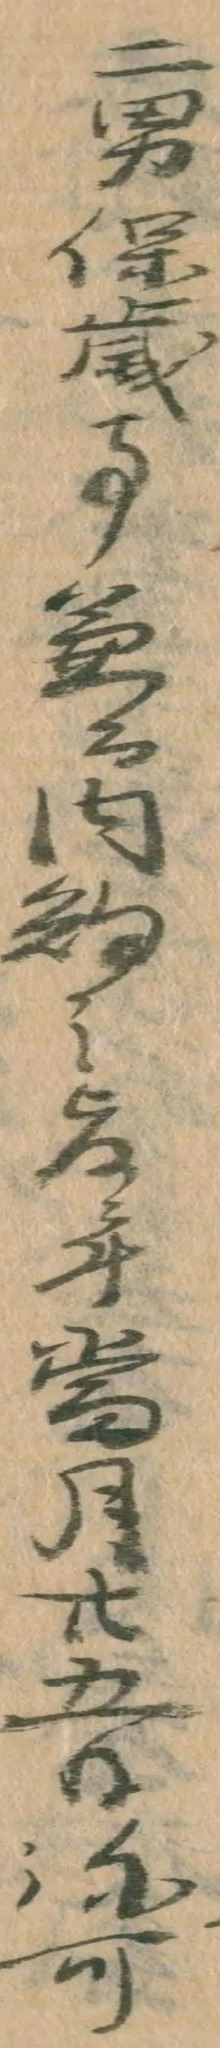二男保歳事兼而内約之旨ニ付當月廿五日弥可
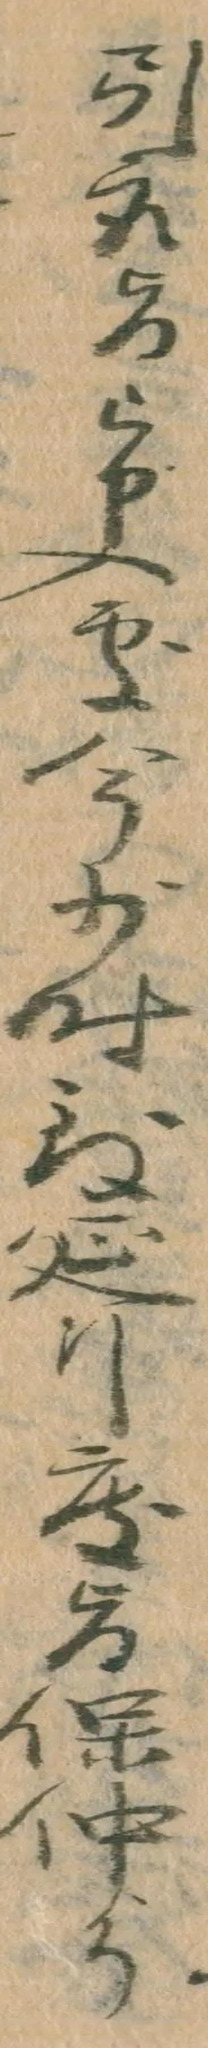引取旨被申入處今少時致延引度旨保仲より
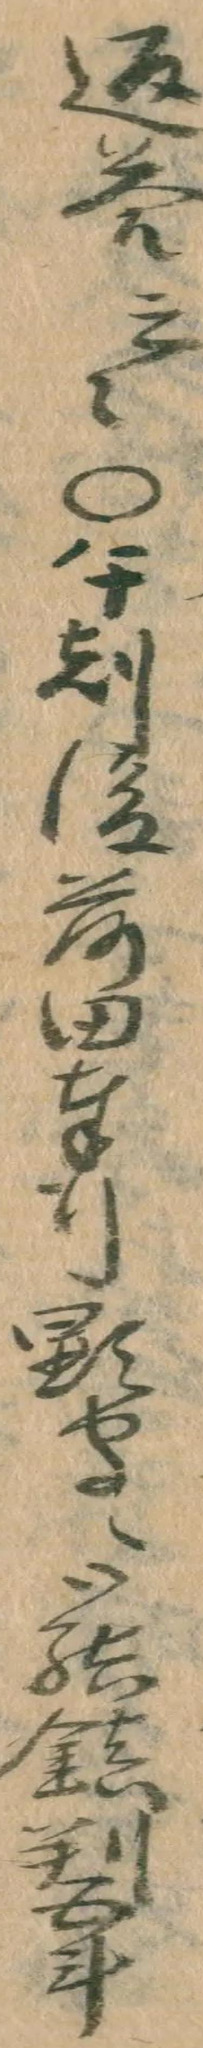返答云々〇午刻後落田奉行顕守へ御結鎮判五斗
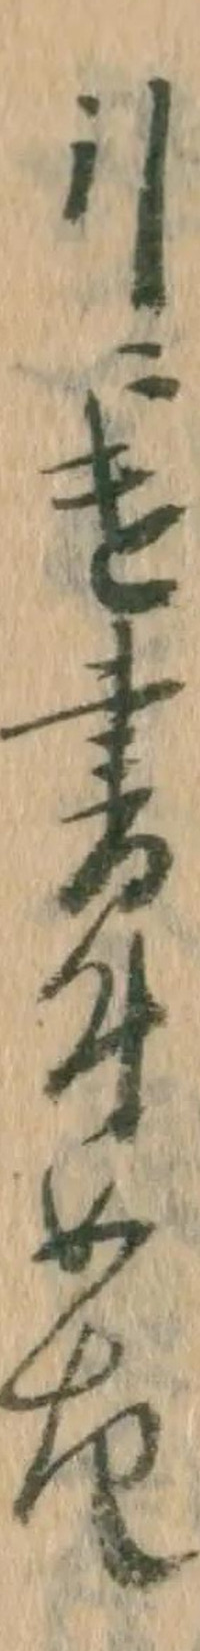引ニ遣書付如左
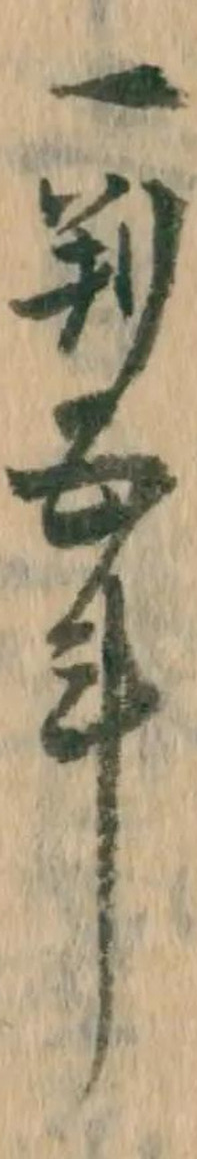一判五斗
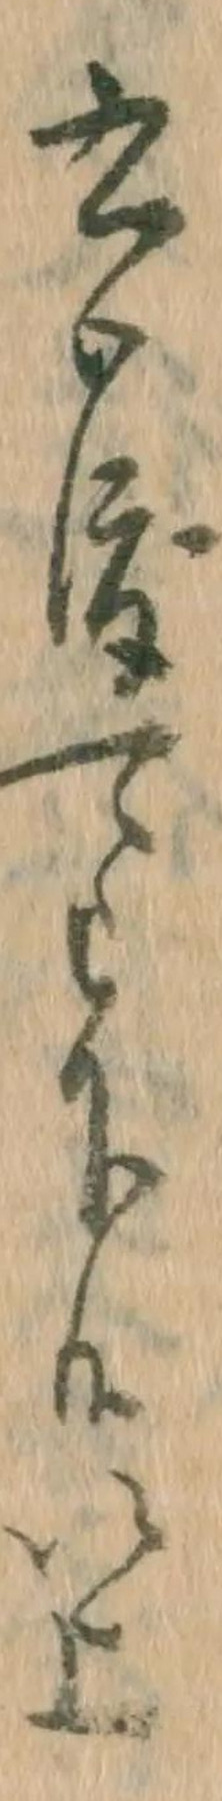書御渡可被下候以上
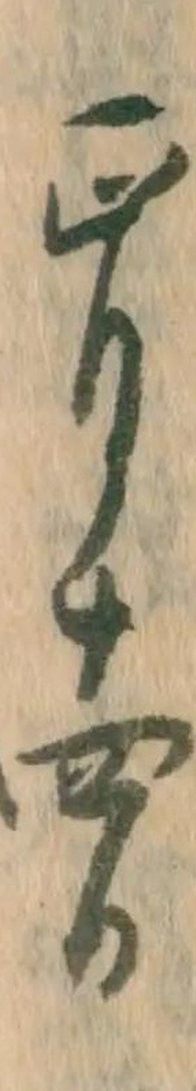正月十四日
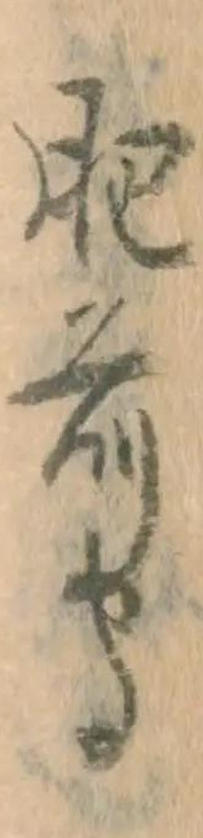肥前守
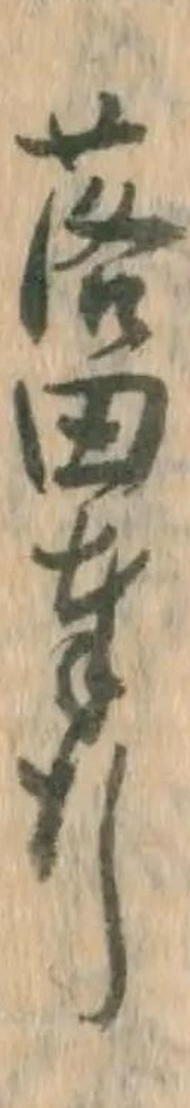落田奉行
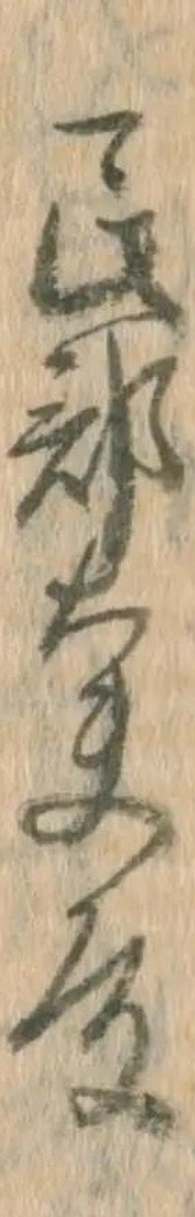民部大夫殿
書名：賀茂社記録. 第63冊
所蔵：国立国会図書館 National Diet Library, JAPAN
